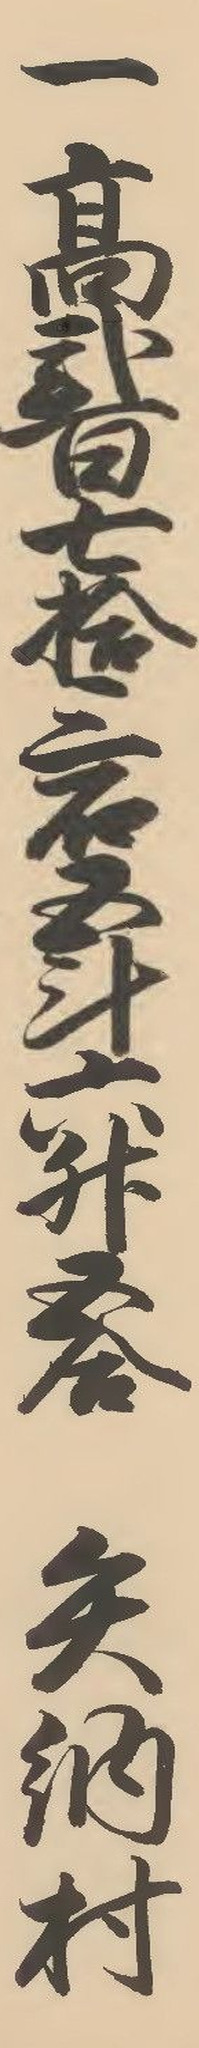一高弐百七拾二石五斗六升五合矢納村
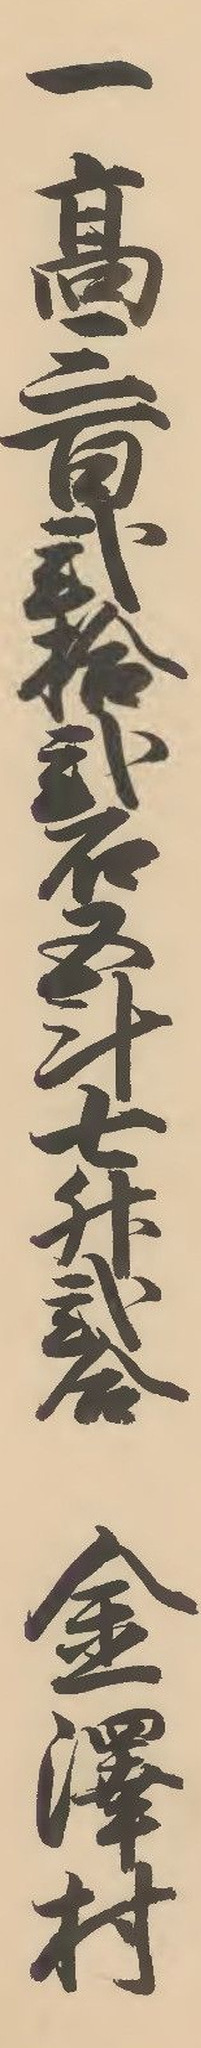一高三百弐拾弐石五斗七升弐合金澤村

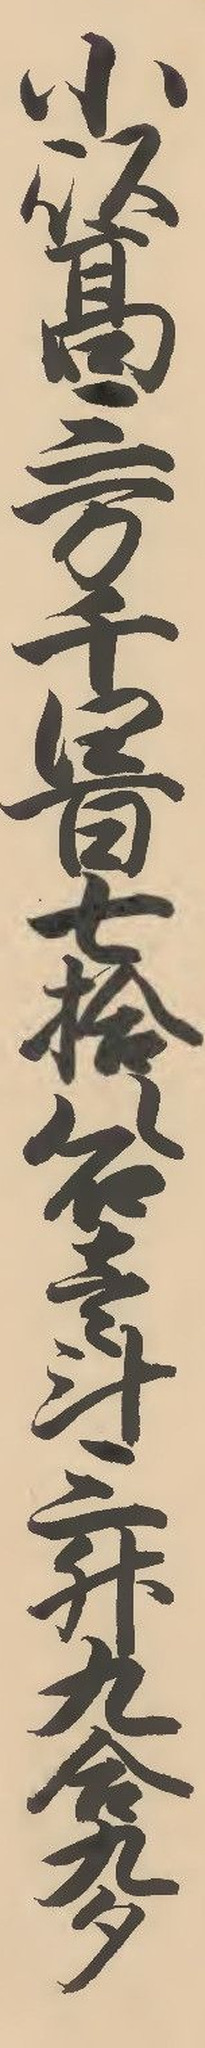小以高三万千四百七拾八石壱斗三升九合九勺
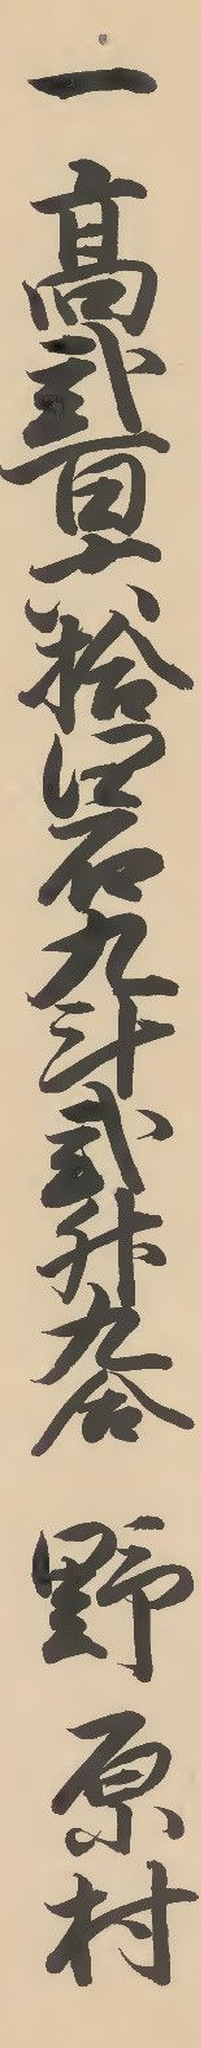一高弐百六拾四石九斗弐升九合野原村
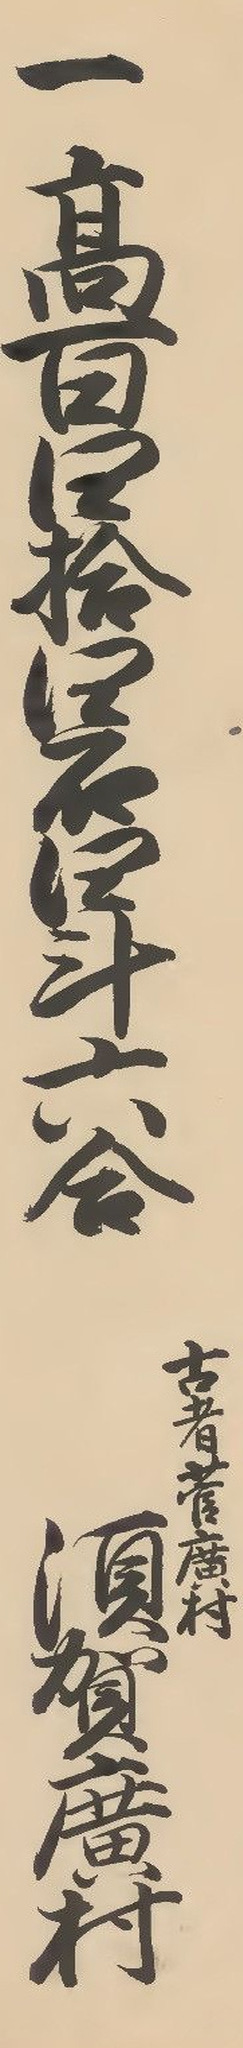一高百四拾四石四斗六合須賀広村
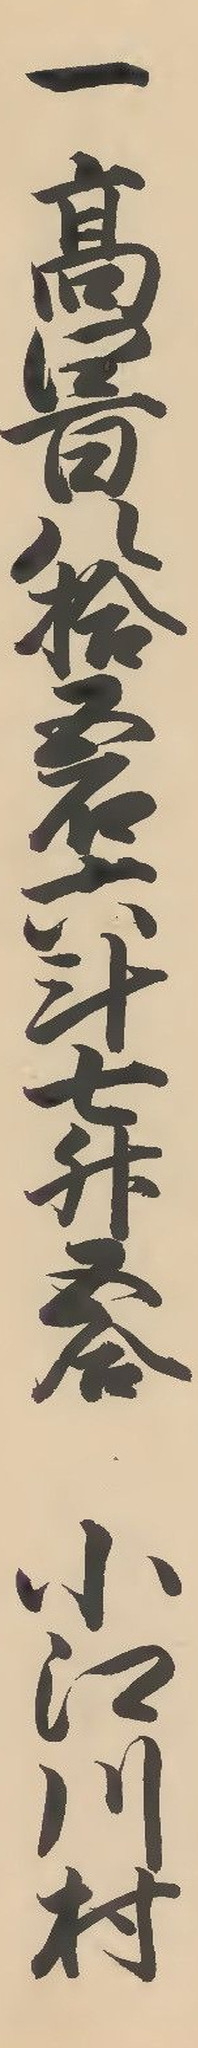一高四百八拾五石六斗七升五合小江川村

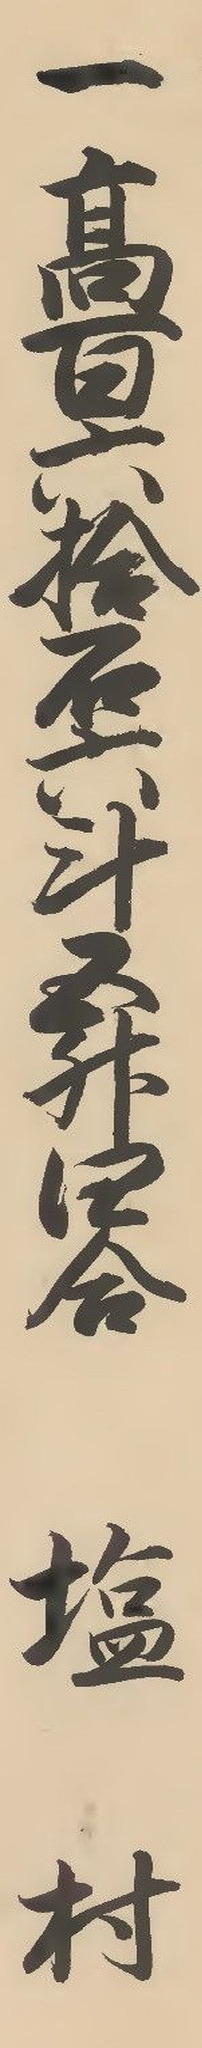一高百六拾石六斗五升四合塩村
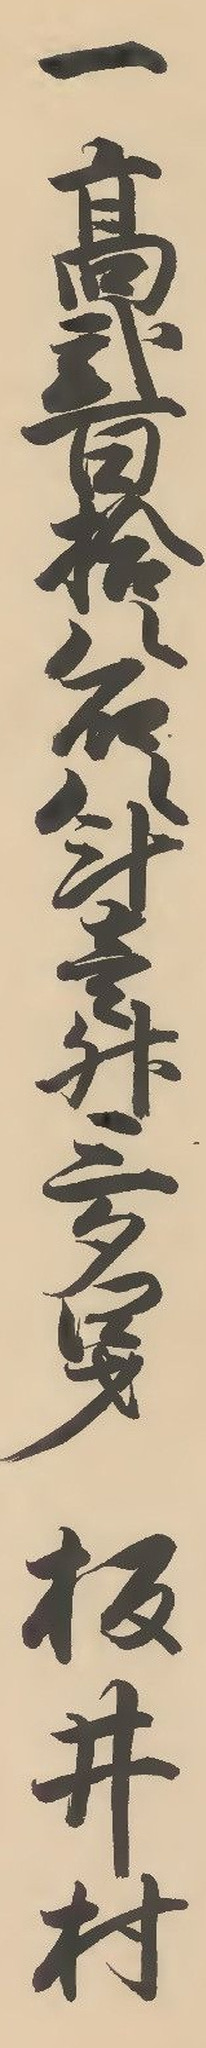一高弐百拾八石八斗壱升三勺四才板井村
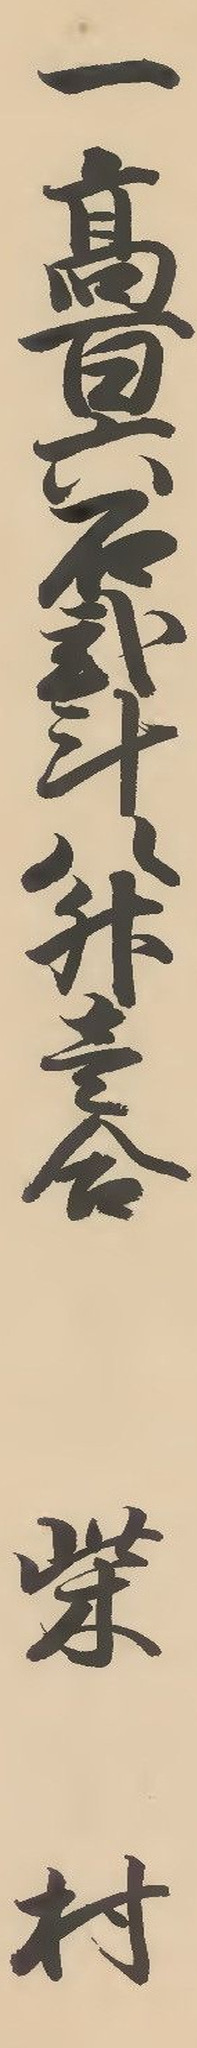一高百六石弐斗八升壱合柴村
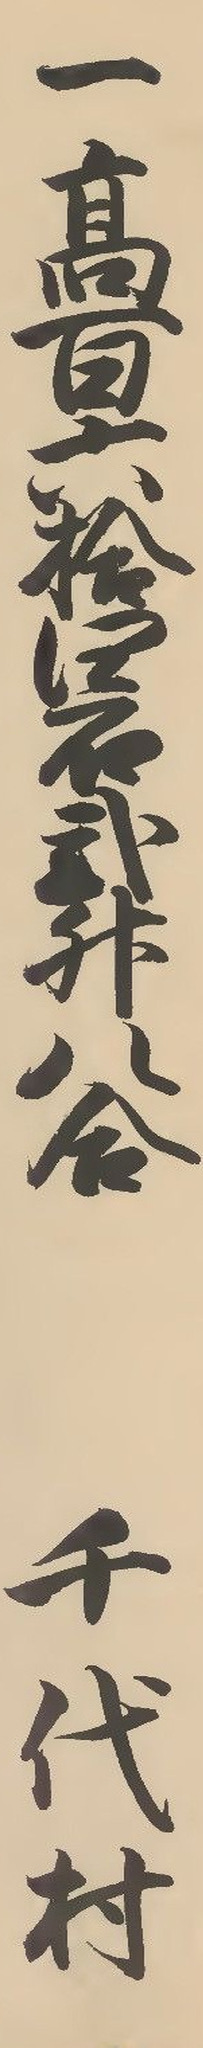一高百六拾四石弐升八合千代村
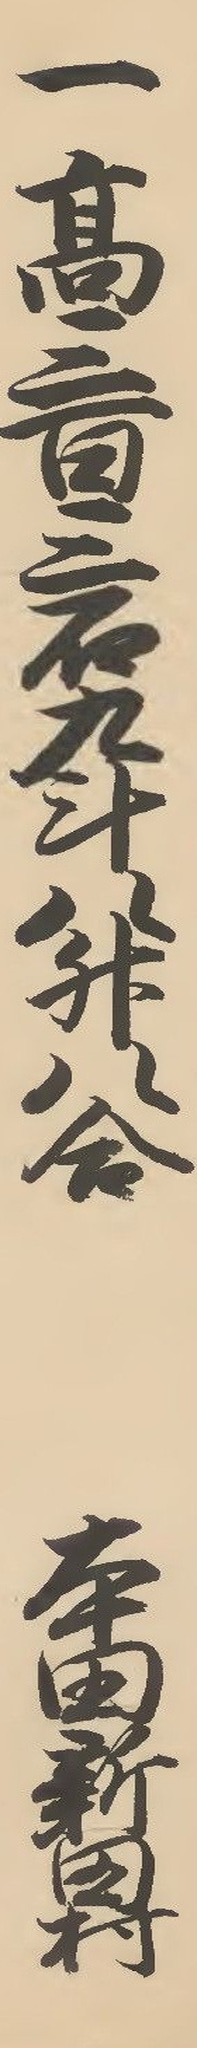一高三百三石九斗八升八合本田新田村
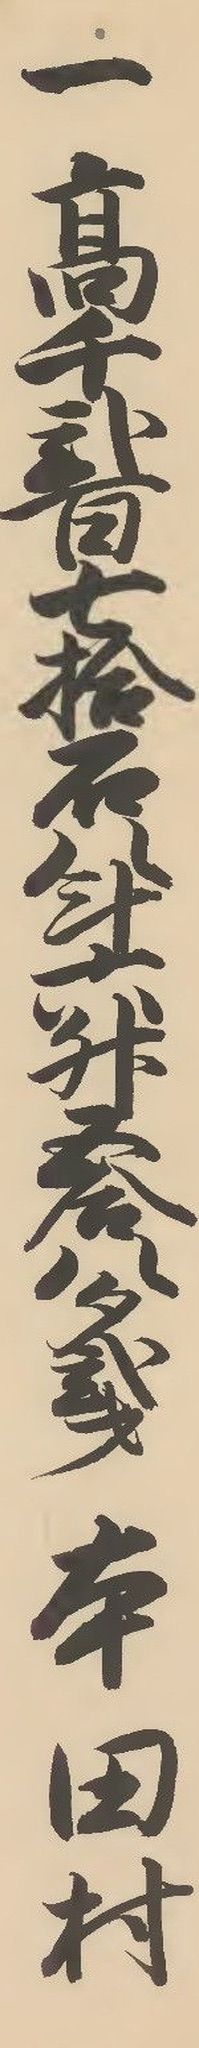一高千弐百七拾石八斗六升五合八勺弐才本田村
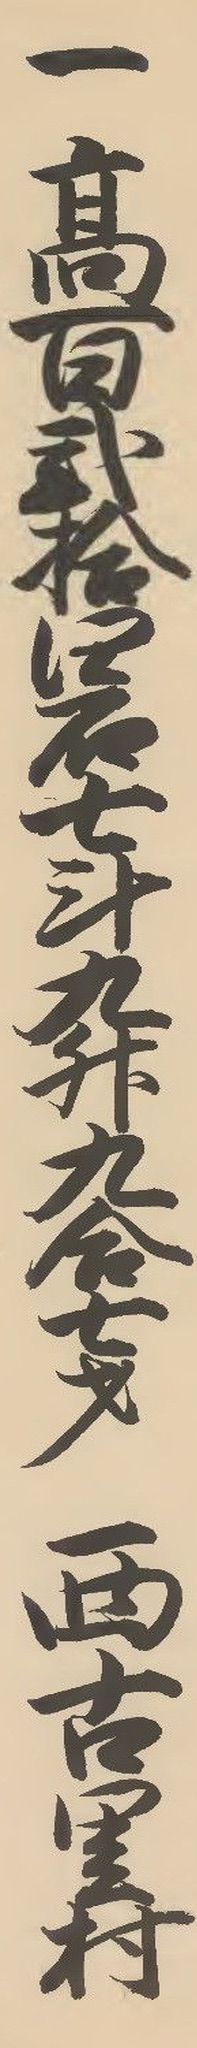一高百弐拾四石七斗九升九合七才西古里村
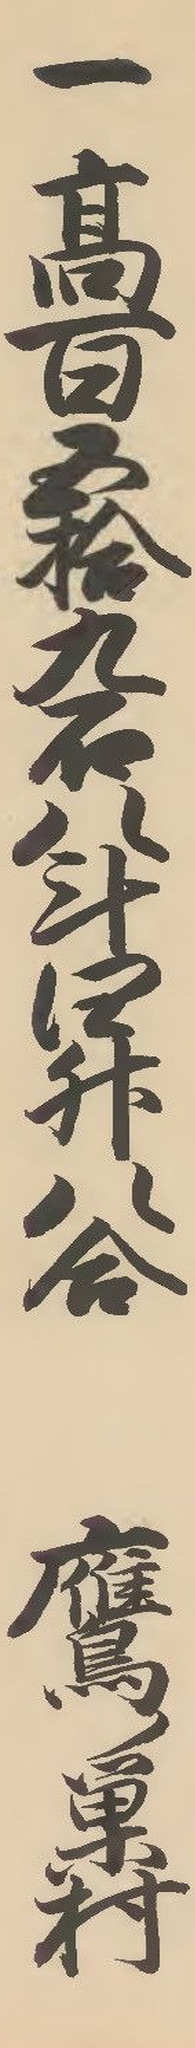一高百五拾九石八斗四升八合鷹ノ巣村

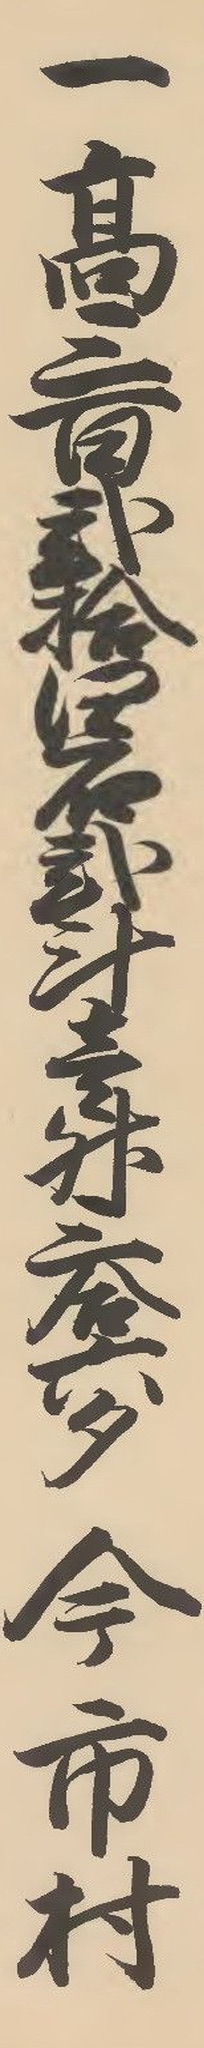一高三百弐拾四石弐斗壱升三合六勺今市村
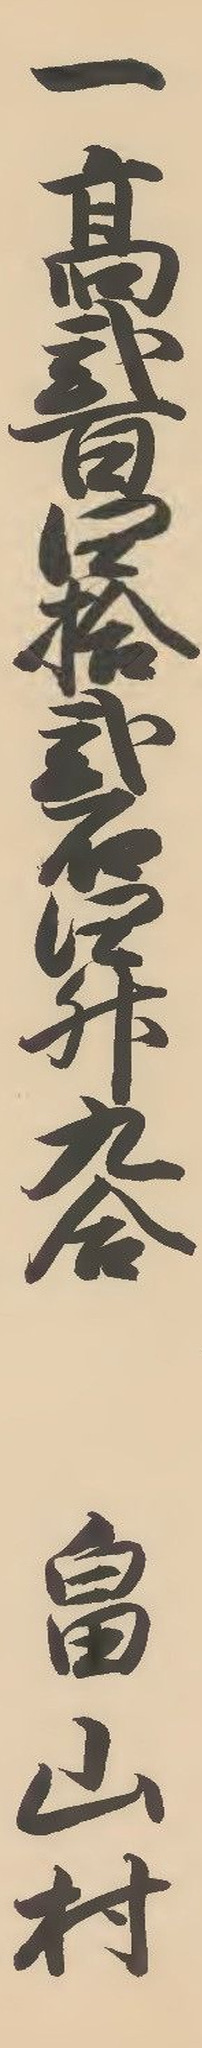一高弐百四拾弐石四升九合畠山村
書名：武蔵国郷帳　上
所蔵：国立公文書館 National Archives of Japan
